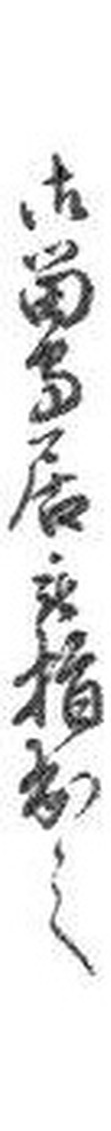御留守居被指出之
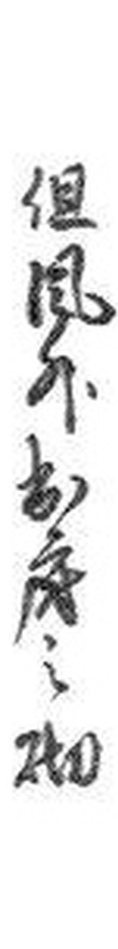但風外出府之砌
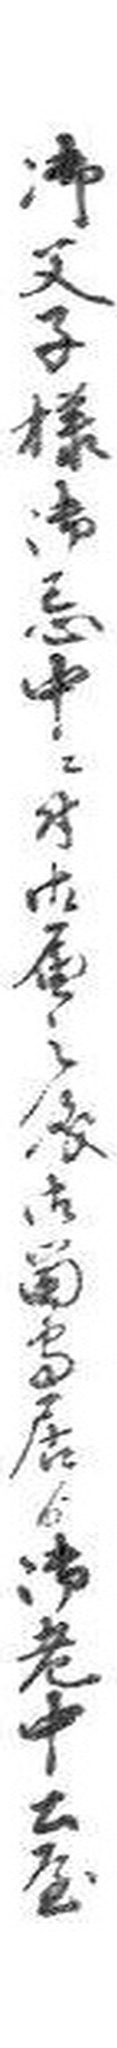御父子様御忌中ニ付御届之儀御留守居ゟ御老中土屋
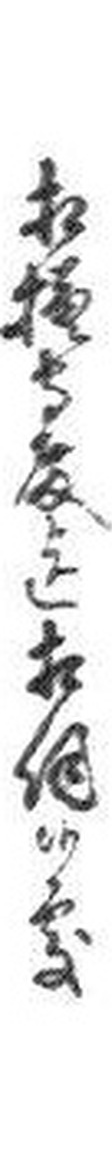相模守殿迄相伺候処
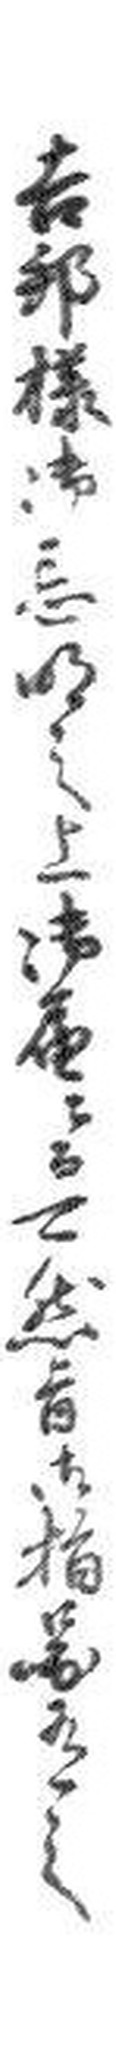吉邦様御忌明之上御届ニ而可然旨御指図有之
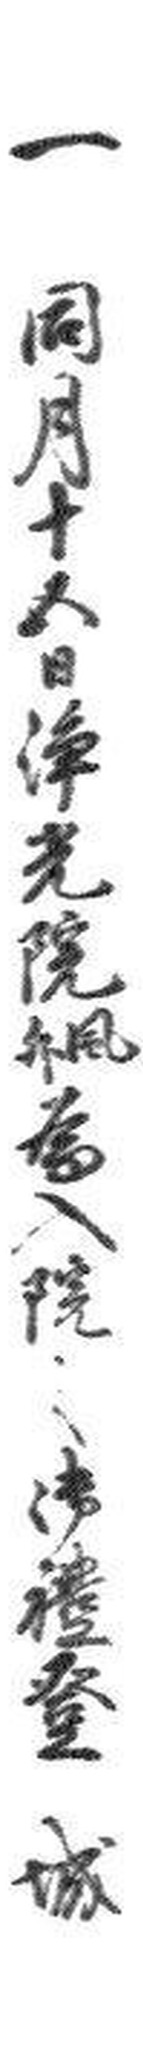一同月十五日浄光院風外為入院之御礼登城
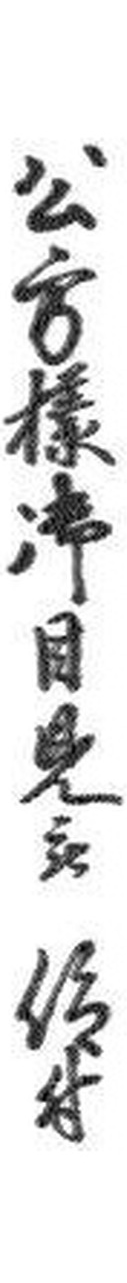公方様御目見被仰付
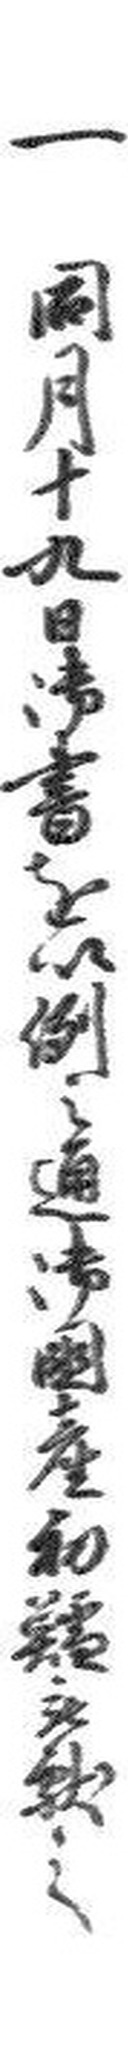一同月十九日御書を以例之通御国産初鱈被献之
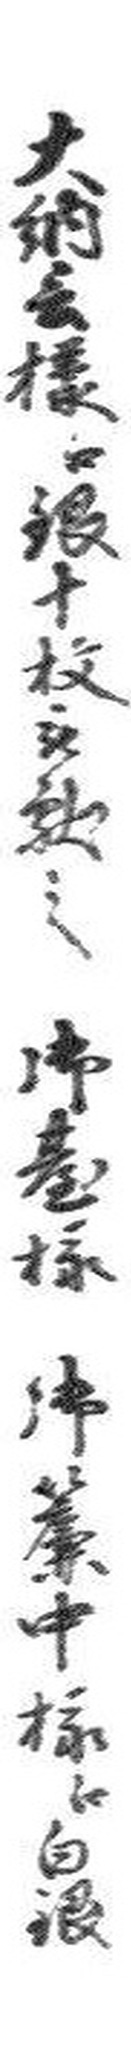大納言様江銀十枚被献之御台様御簾中様江白銀
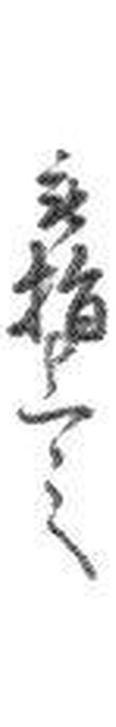被指上之
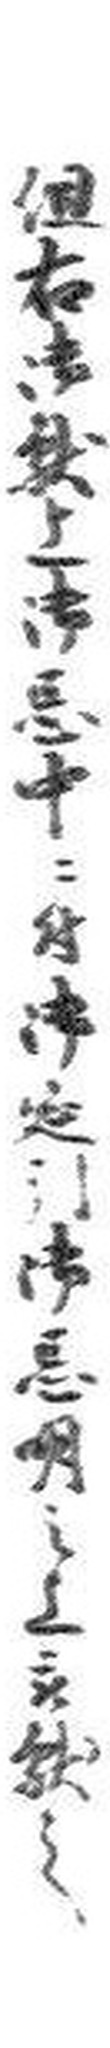但右御献上御忌中ニ付御延引御忌明之上被献之
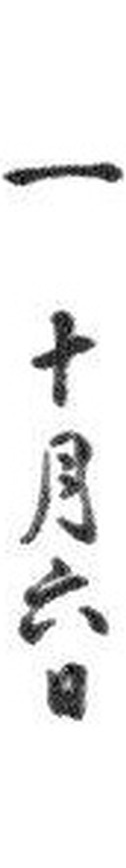一十月六日
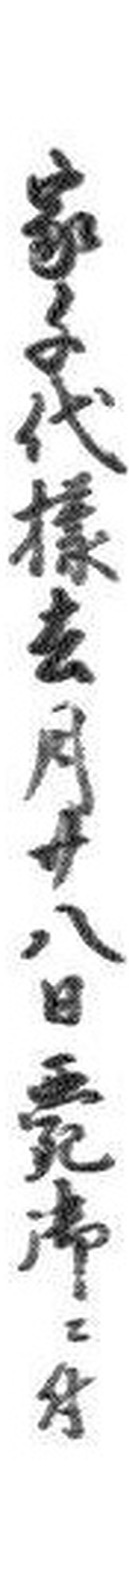家千代様去月廿八日薨御ニ付

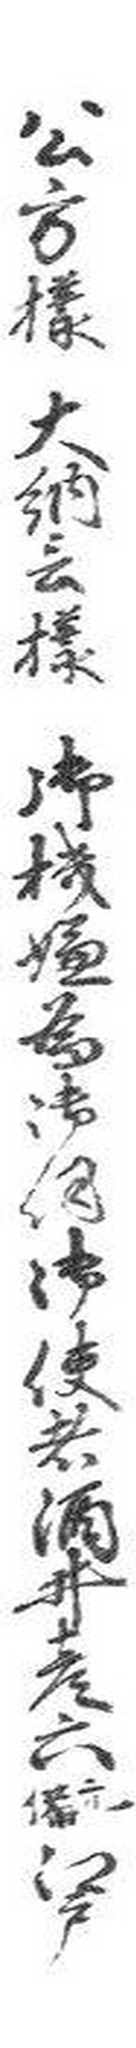公方様大納言様御機嫌為御伺御使者酒井彦六元備江戸
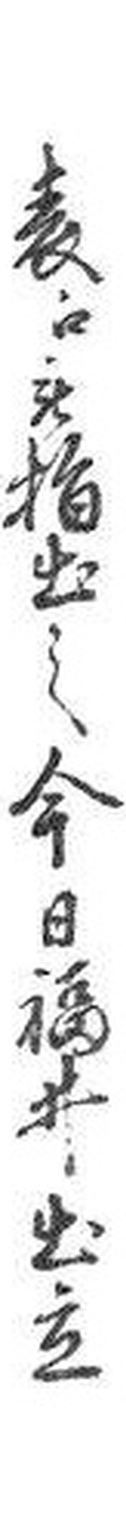表江被指出之今日福井出立
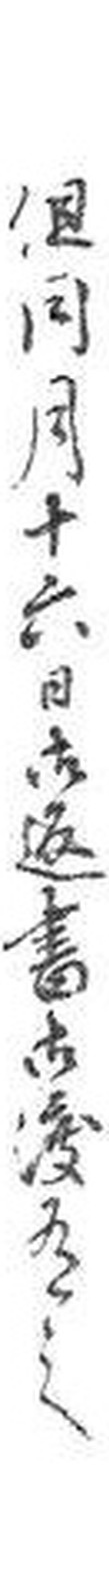但同月十六日御返書御渡有之
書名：家譜 二十四 吉品公 従宝永三年到同五年
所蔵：福井県文書館 Fukui Prefectural Archives
